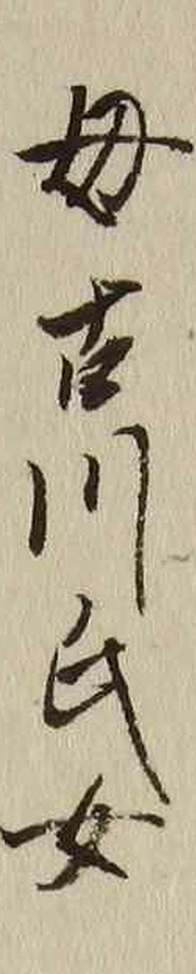母古川氏女
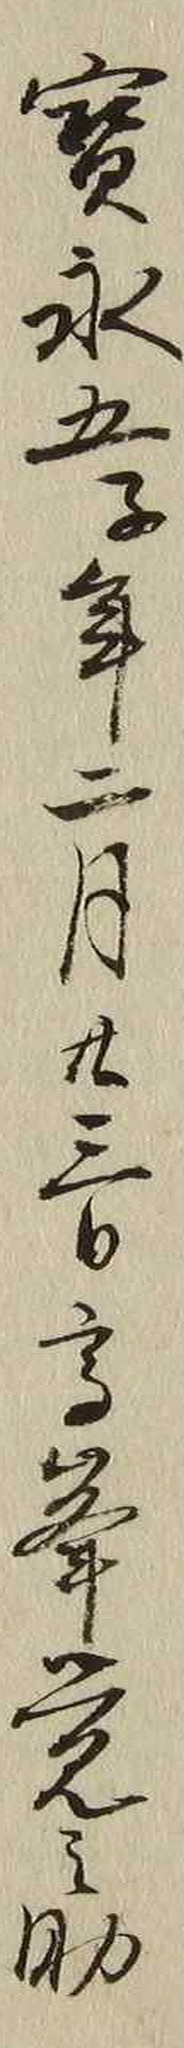宝永五子年二月廿三日高峰覚之助
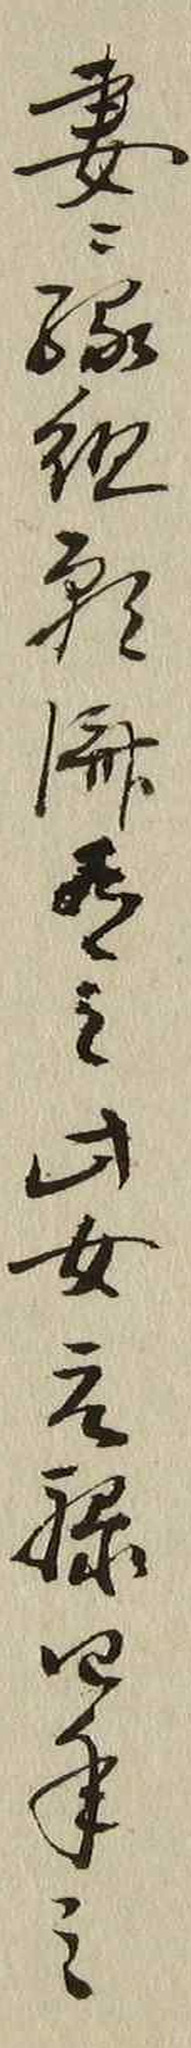妻ニ縁組願済有之此女元禄四年之
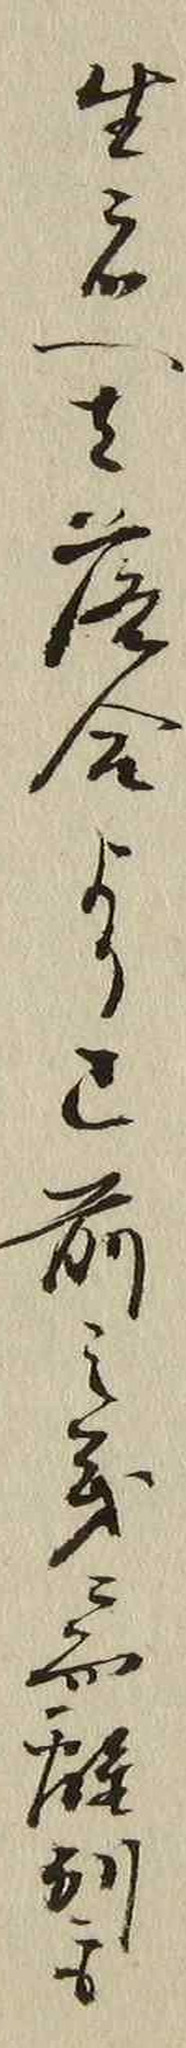生ニ候へ者落合より已前之義ニ而離別ニも
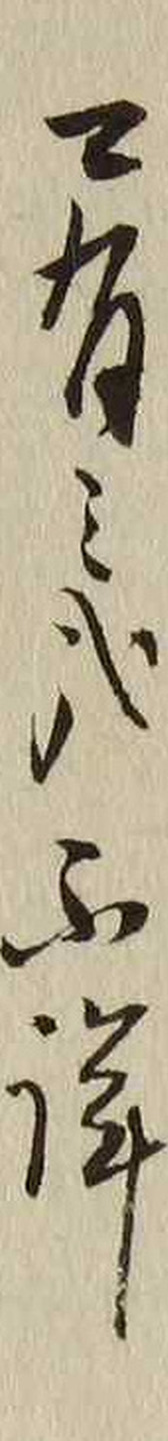可有之哉不詳
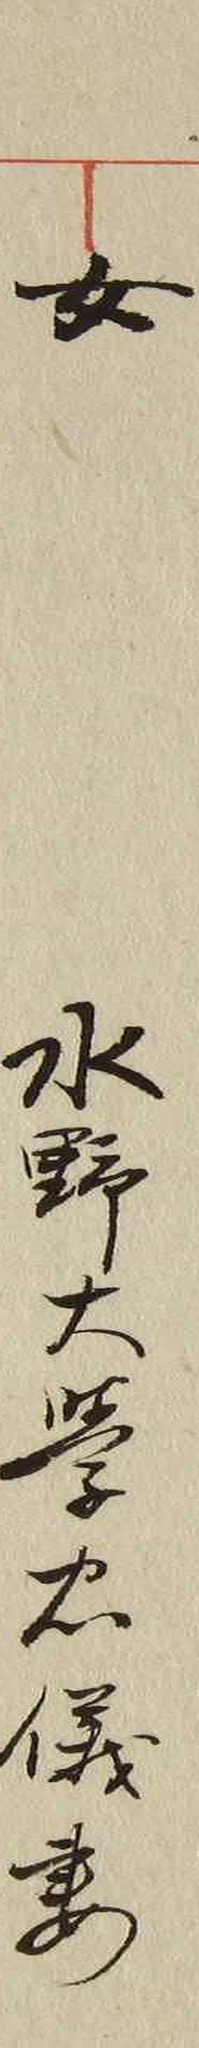女水野大学忠儀妻
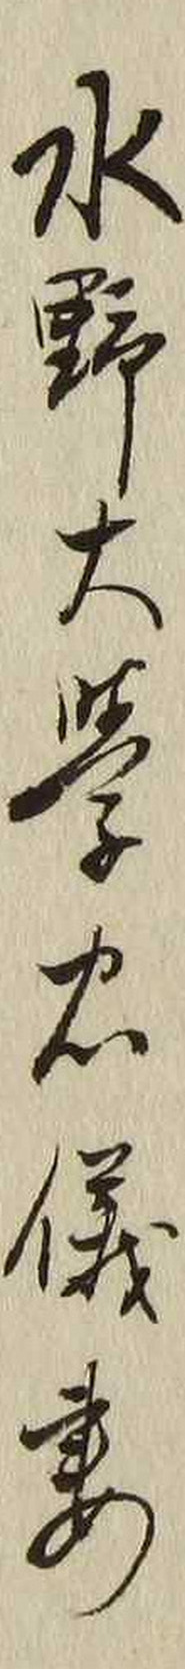女水野大学忠儀妻
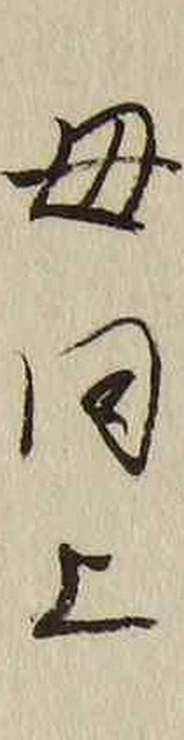母同上
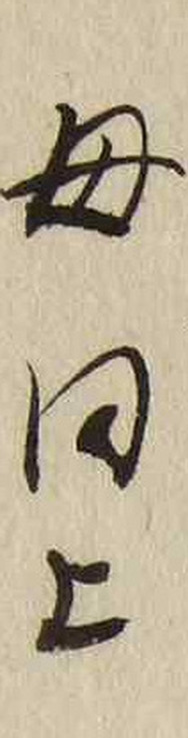母同上

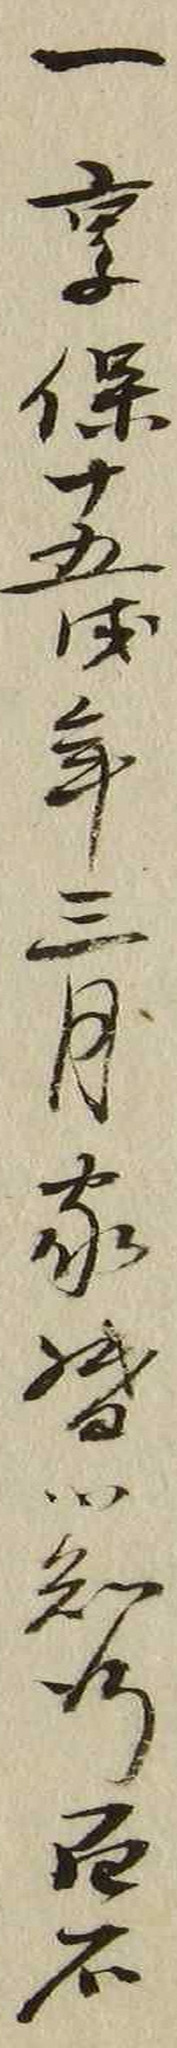一享保十五戌年三月家督御知行百石
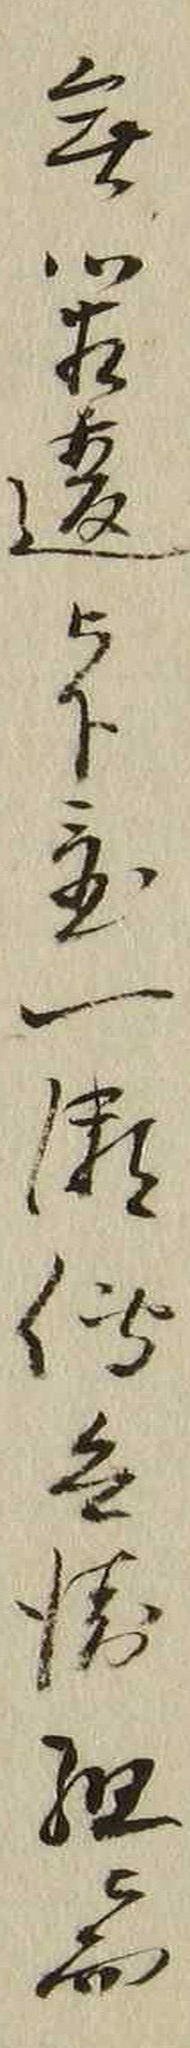無御相違被下置一瀬伝兵衛組ニ而
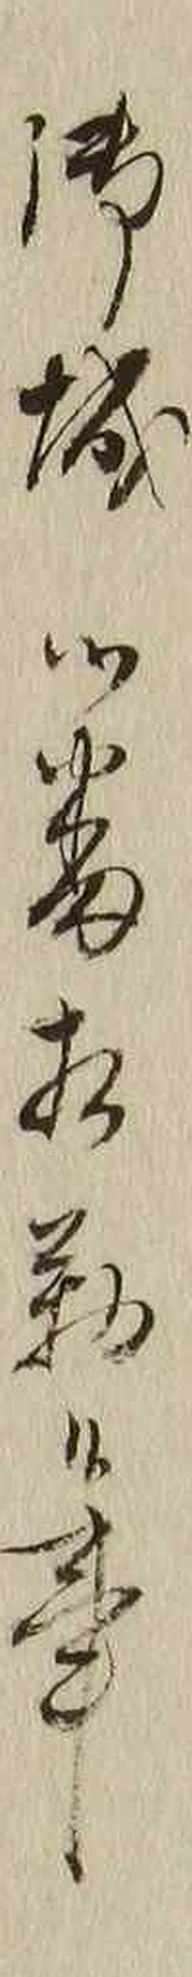御城御番相勤候事
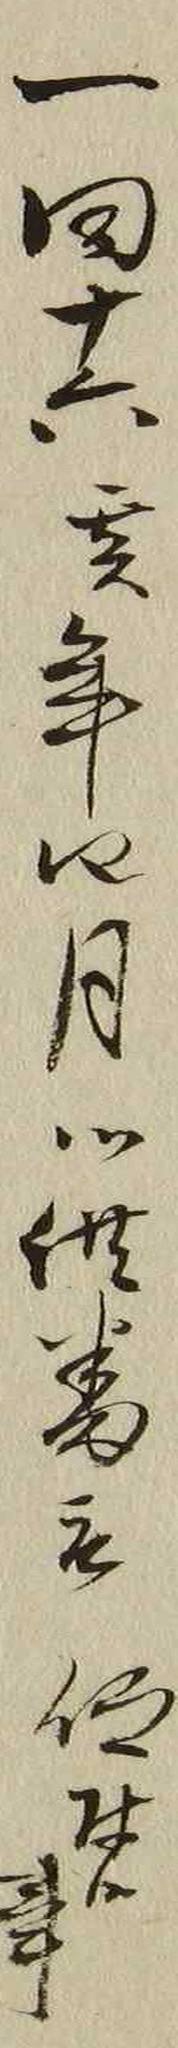一同十六亥年四月御供番被仰付候事
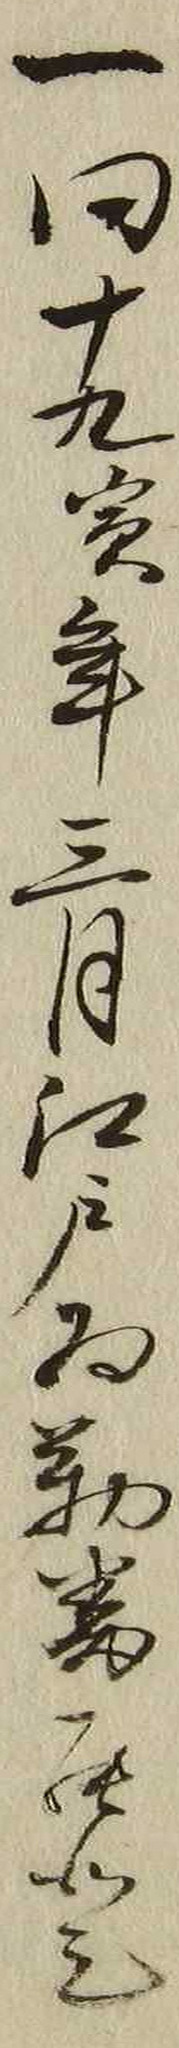一同十九寅年三月江戸為勤番罷登
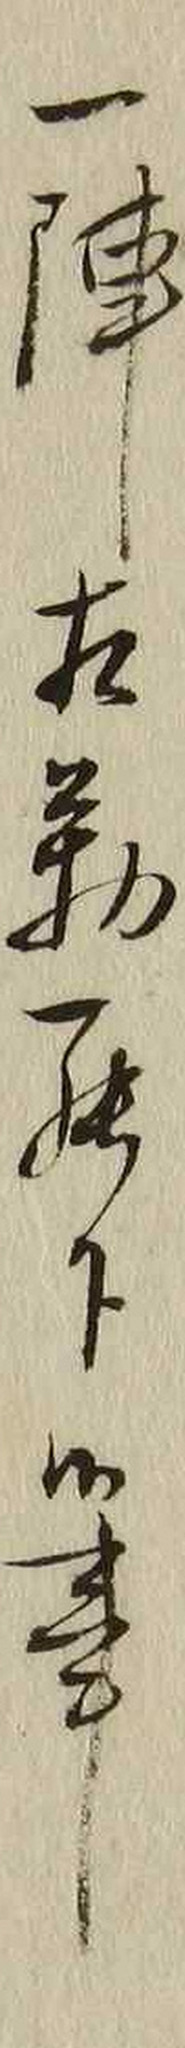一陣相勤罷下候事
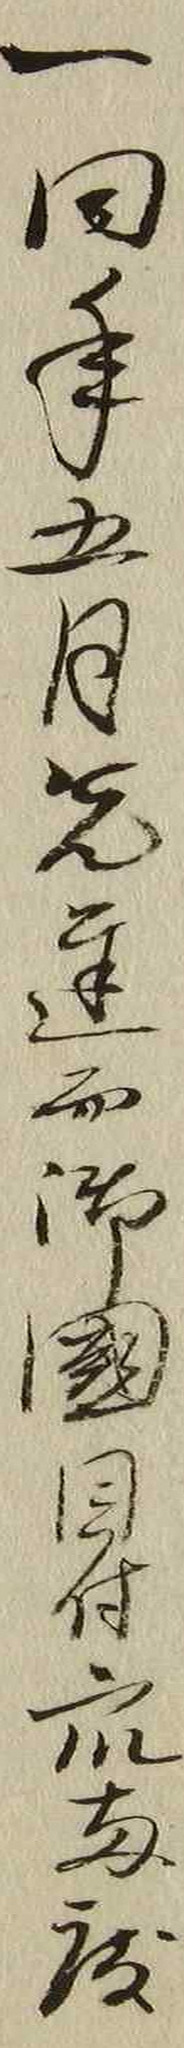一同年五月先達而御国目付衆両度
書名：諸士系譜　巻之359　す之部9
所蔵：会津若松市立会津図書館
